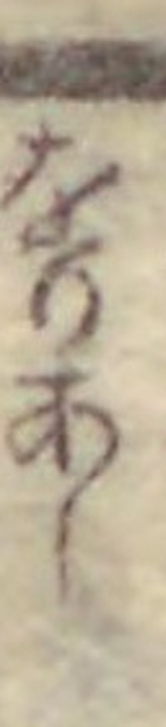をりあし
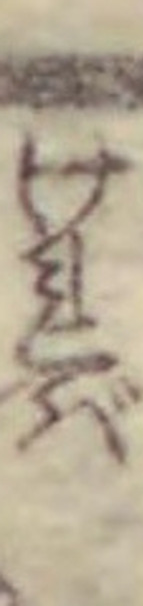ければ
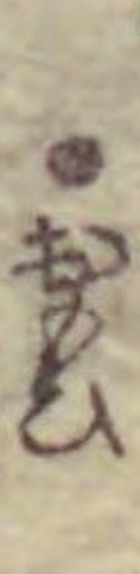●おもひ
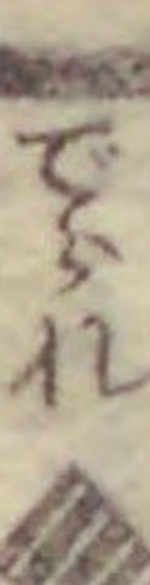でられ
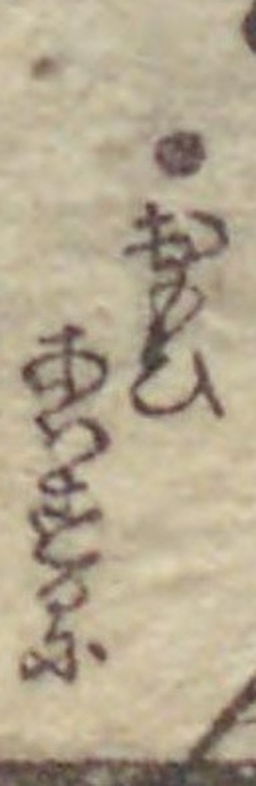あはするに
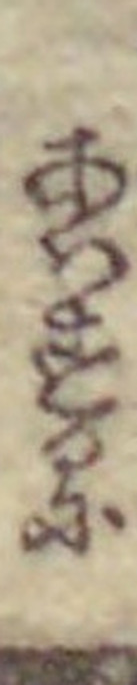あはするに
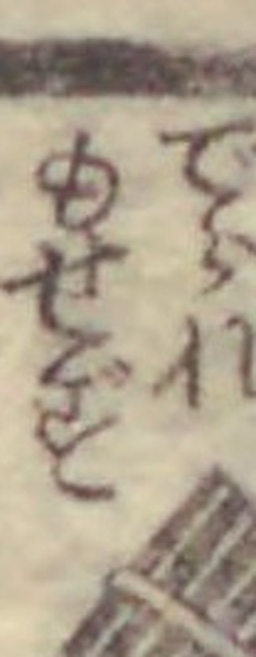もせず
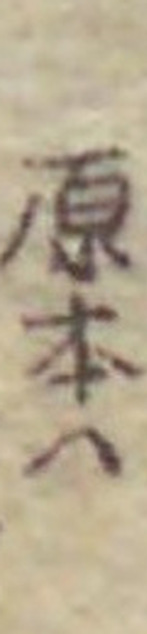原本は
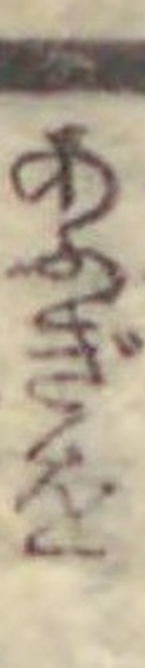あふぎを
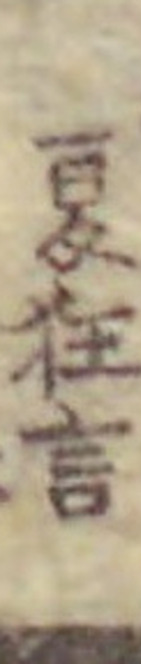夏狂言
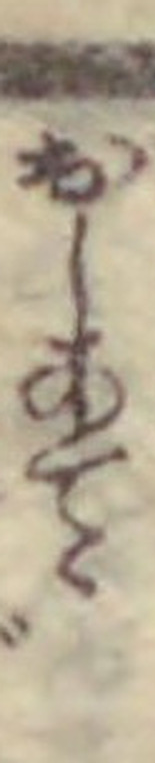おしあてゝ
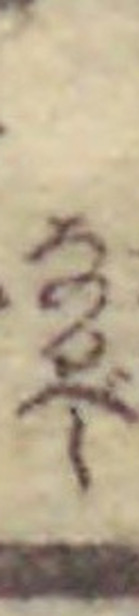なるべし
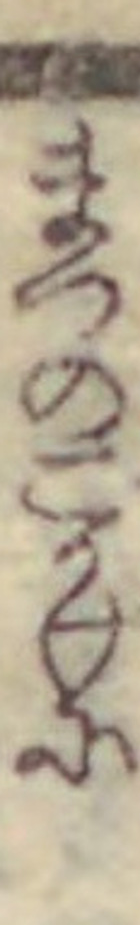まつのこかげに
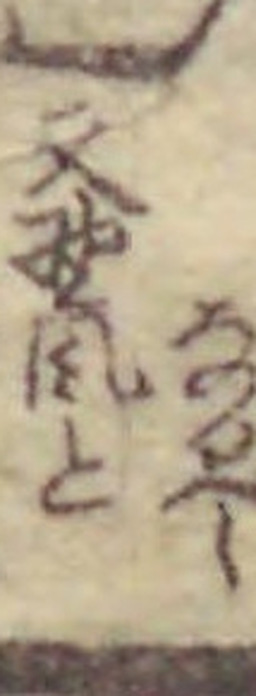又野風と
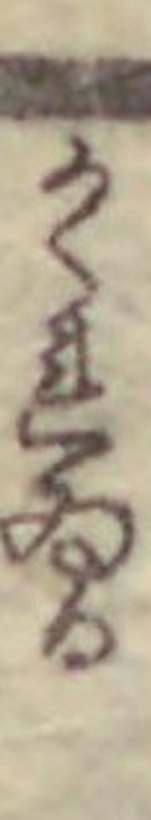かくれゐる
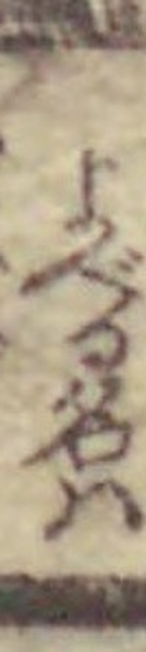よべる名は
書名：大時代唐土化物 3巻. 曽我太夫染
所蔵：国立国会図書館 National Diet Library, JAPAN
